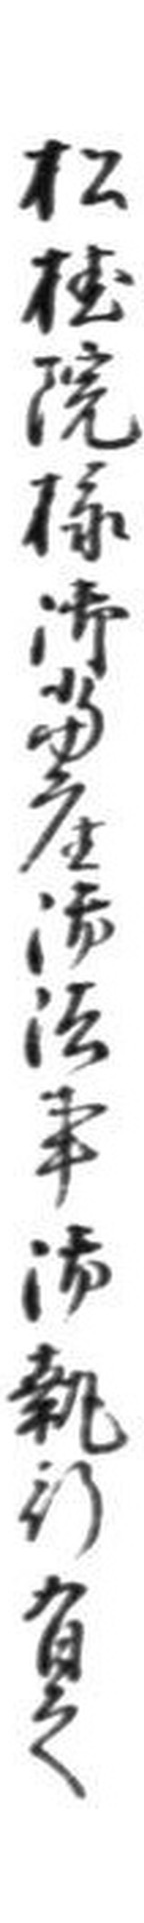松桂院様御当座御法事御執行有之
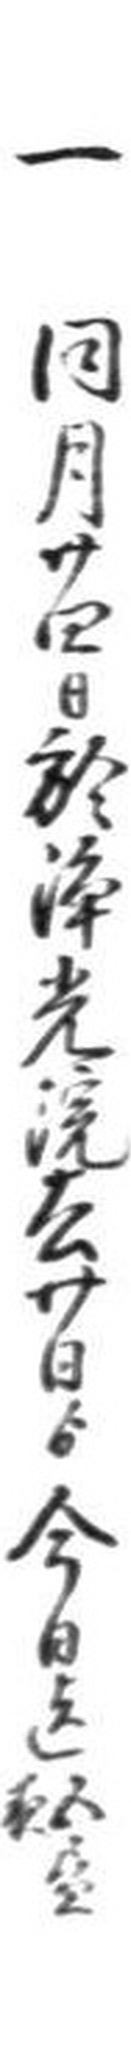一同月廿四日於浄光院去廿ゟ今日迄五昼夜
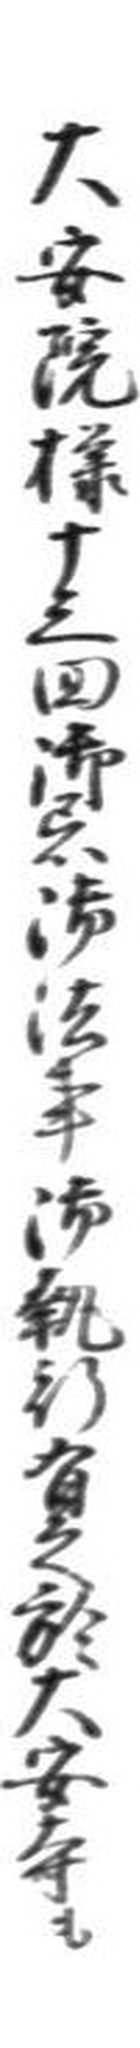大安院様十三回御忌御法事御執行有之於大安寺も
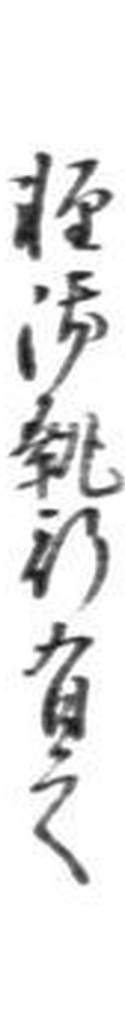軽御執行有之
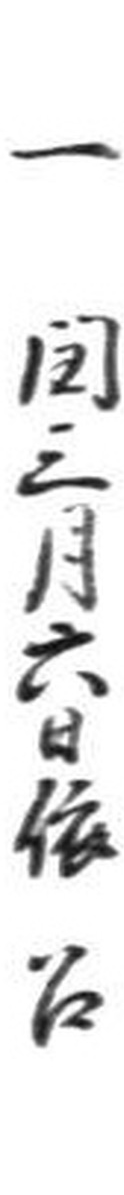一閏三月六日依召
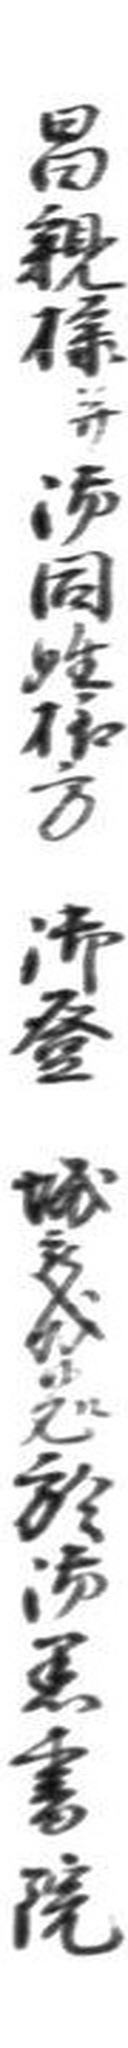昌親様并御同姓様方御登城被成候処於御黒書院
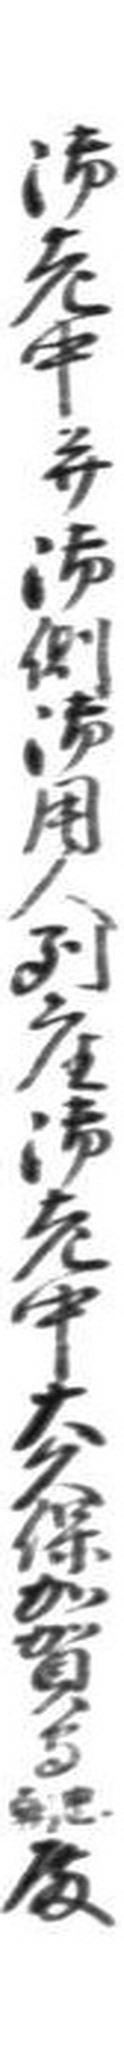御老中并御側御用人列座御老中大久保加賀守忠朝殿
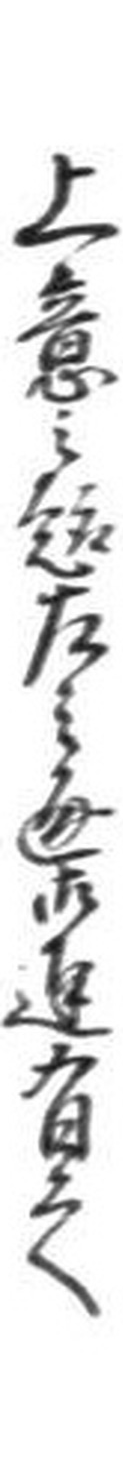上意之趣左之通御達有之

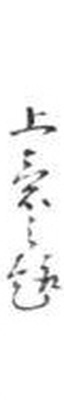上意之趣
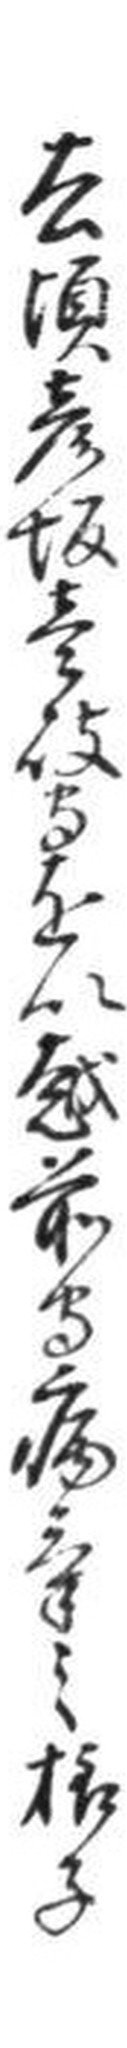去頃彦坂壱岐守を以越前守病気之様子
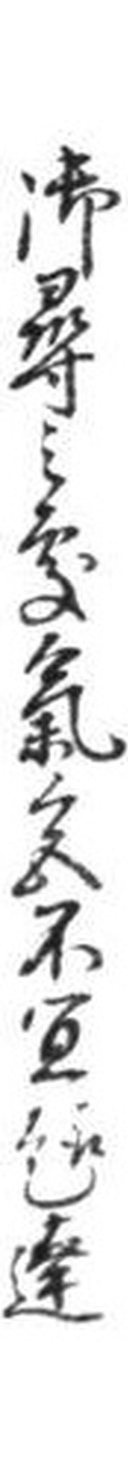御尋之処気色不宜趣達
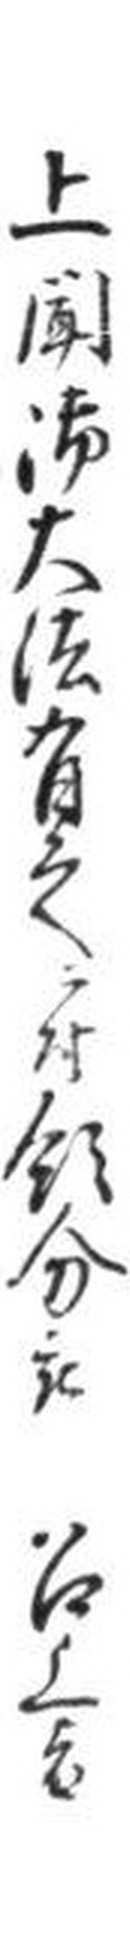上聞御大法有之ニ付領分被召上旨
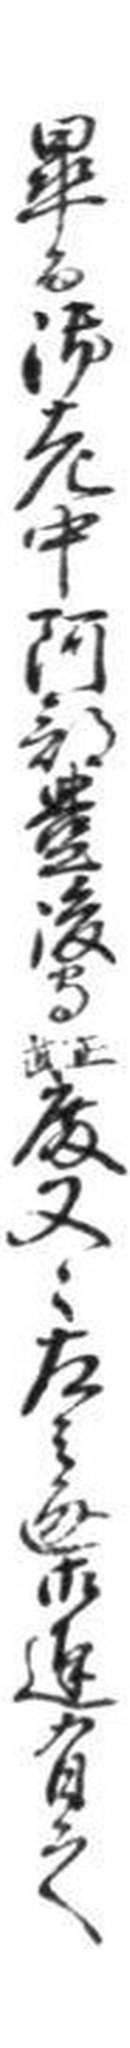畢而御老中阿部豊後守正武殿又々左之通御達有之
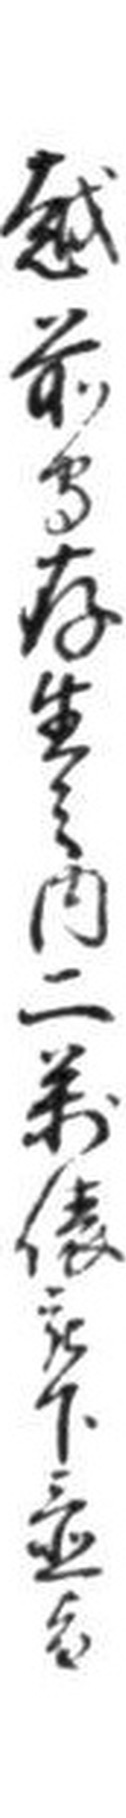越前守存生之内二万俵被下置旨
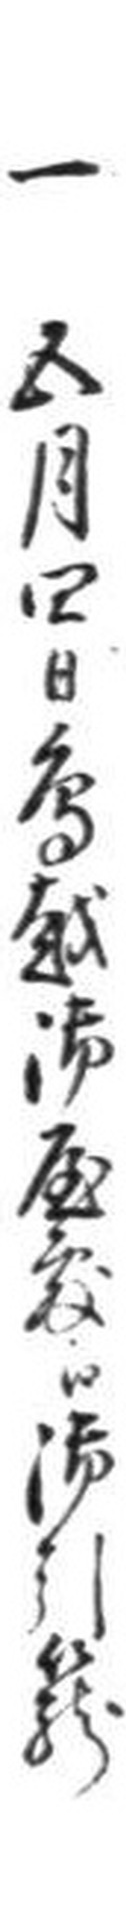一五月四日鳥越御屋敷江御引籠
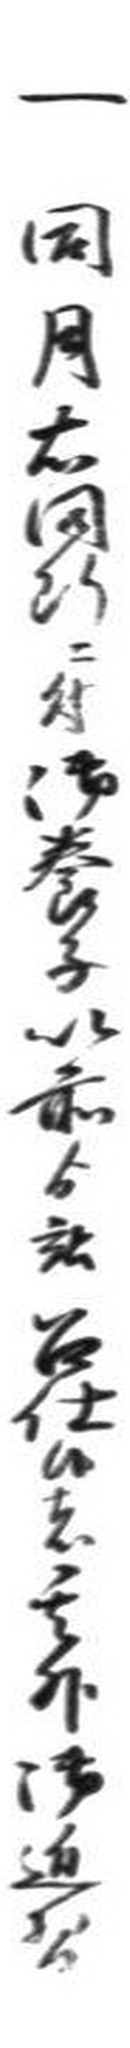一同月右同断ニ付御養子以前ゟ被召仕候者其外御近習
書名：家譜 十五 綱昌公 従天和元年到元禄十二年
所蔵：福井県文書館 Fukui Prefectural Archives
